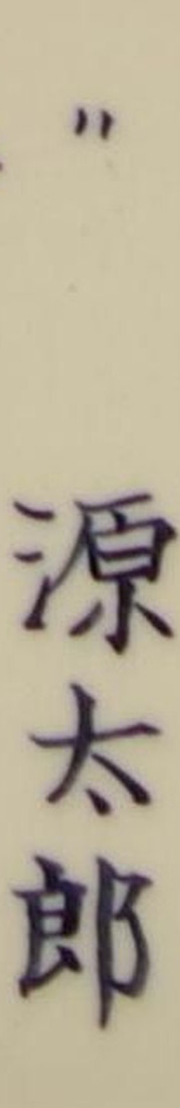源太郎
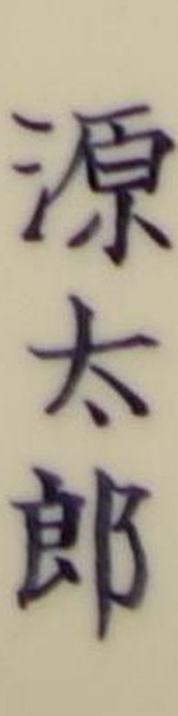源太郎
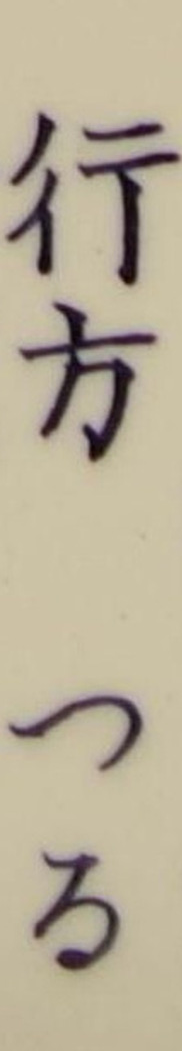行方つる
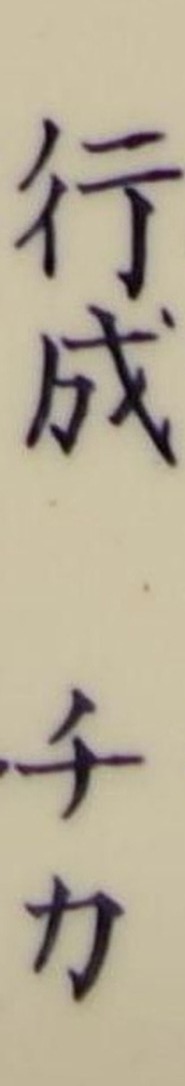行成チカ
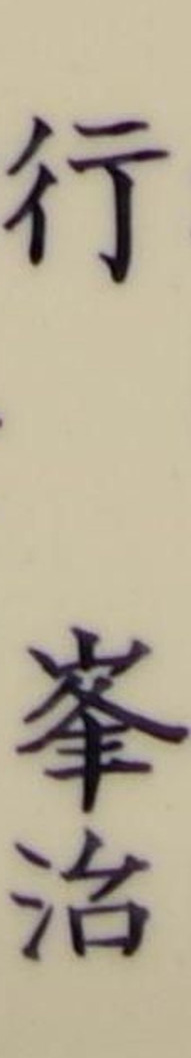行峯治
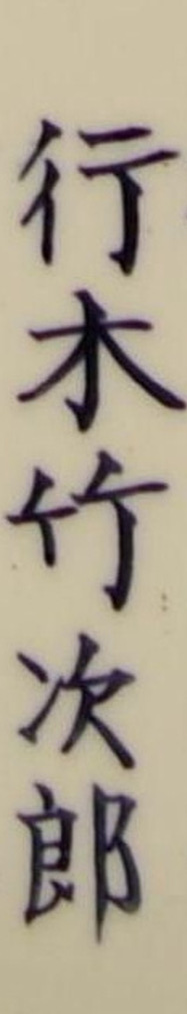行木竹次郎
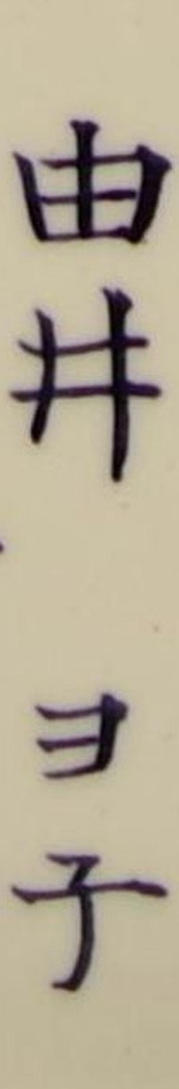由井ヨ子
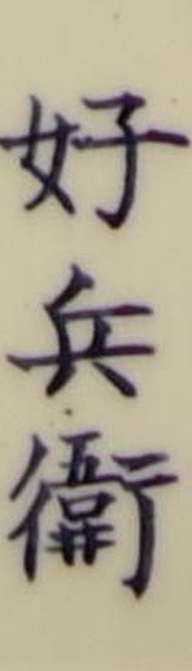好兵衛
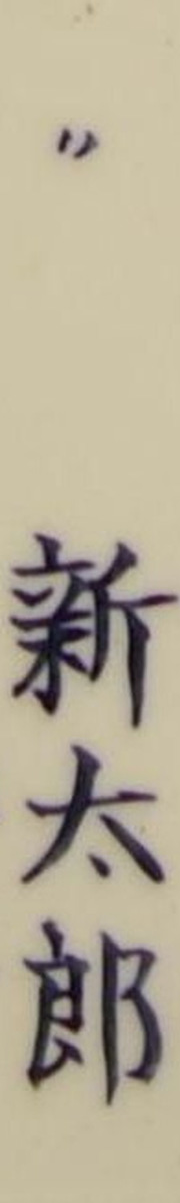新太郎
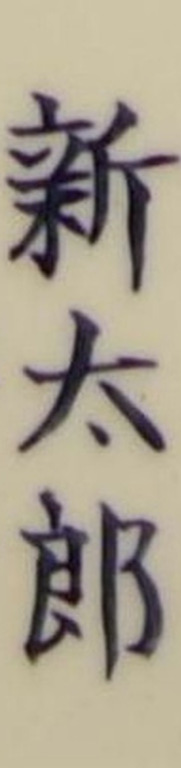新太郎
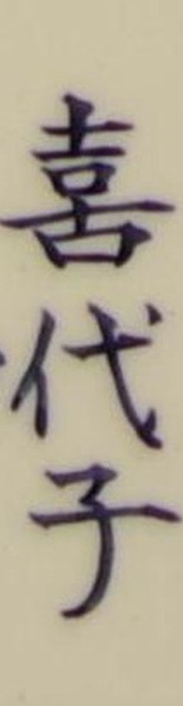喜代子
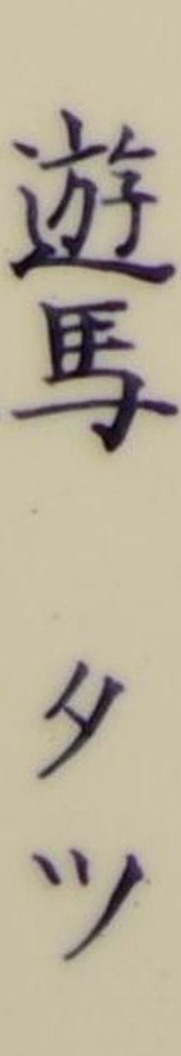遊馬タツ
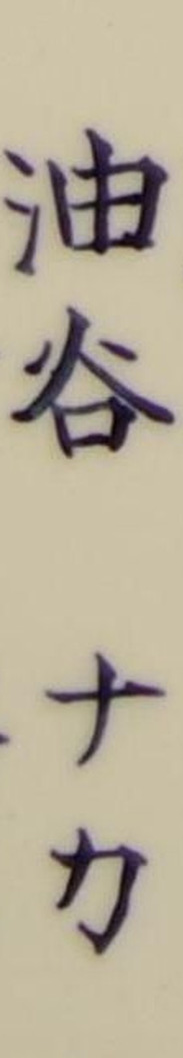油谷ナカ
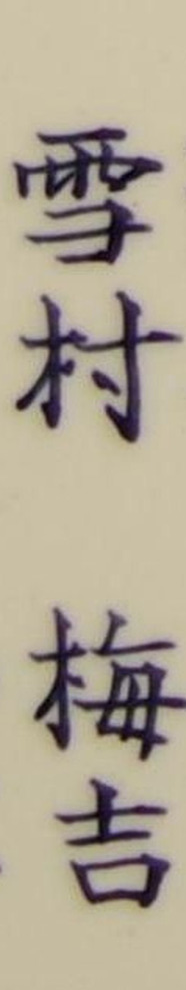雪村梅吉
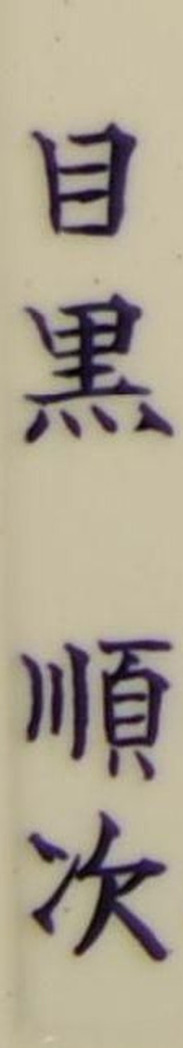日黒順次

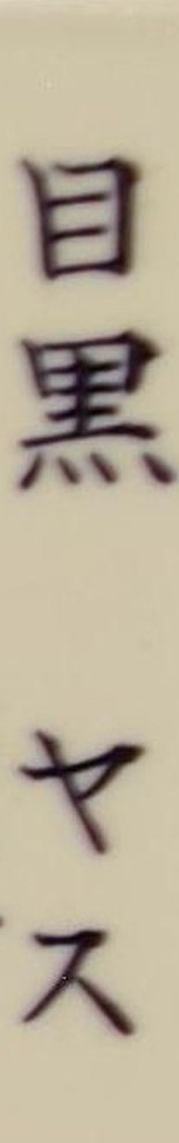目黒ヤス
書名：E~L
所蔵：高野山金剛峯寺
